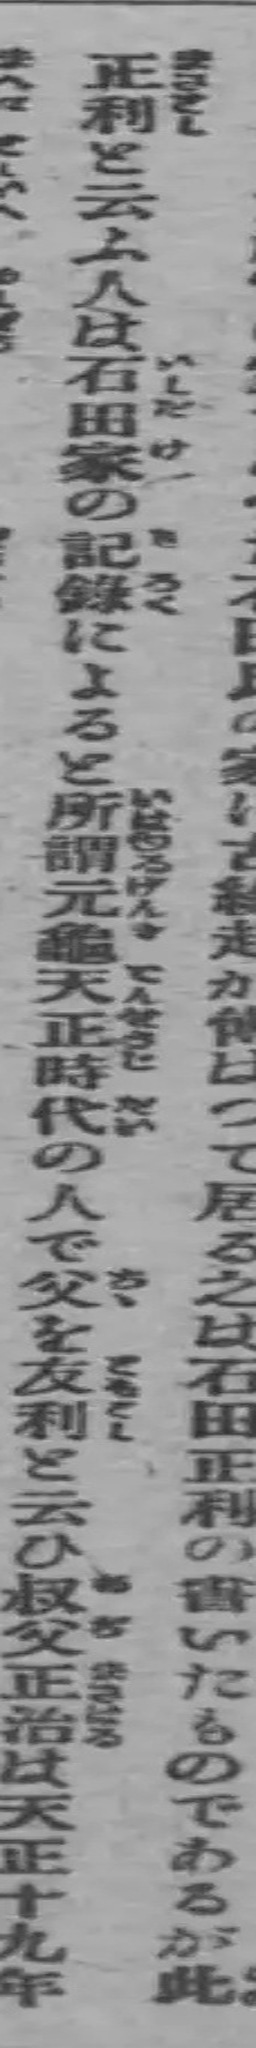正利と云ふ人は石田家の記録によると所謂元亀天正時代の人で父を友利と云ひ叔父正治は天正十九年
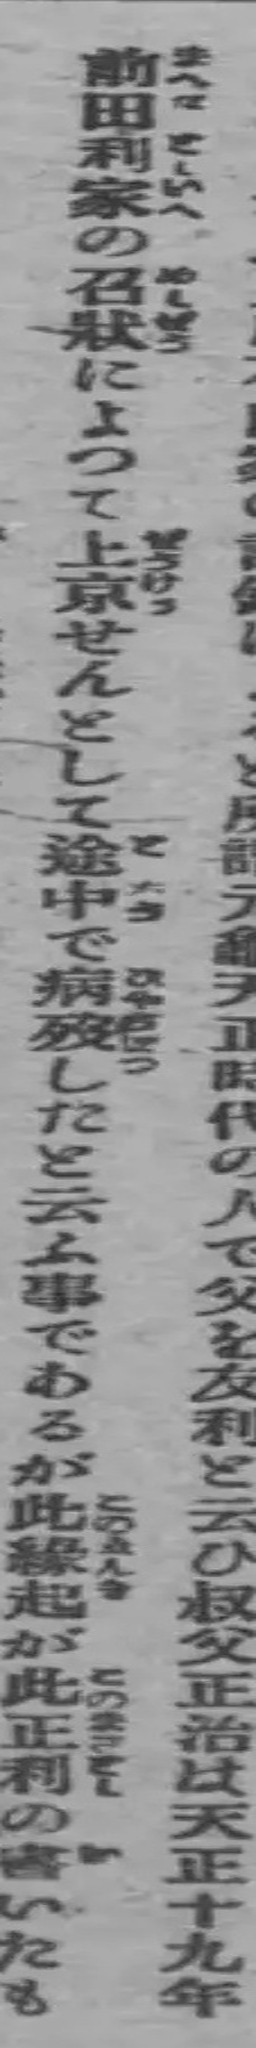石田正治前田利家の召状によつて上京せんとして途中で病没したと云ふ事であるが此縁起が此正利の書いたも
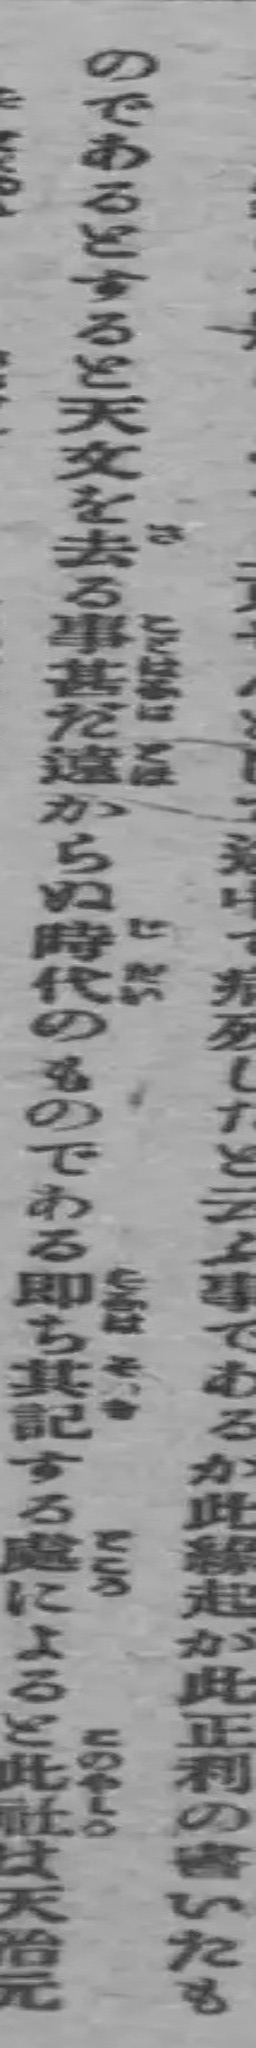のであるとすると天文を去る事甚だ遠からぬ時代のものである即ち其記する処によると此社は天治元
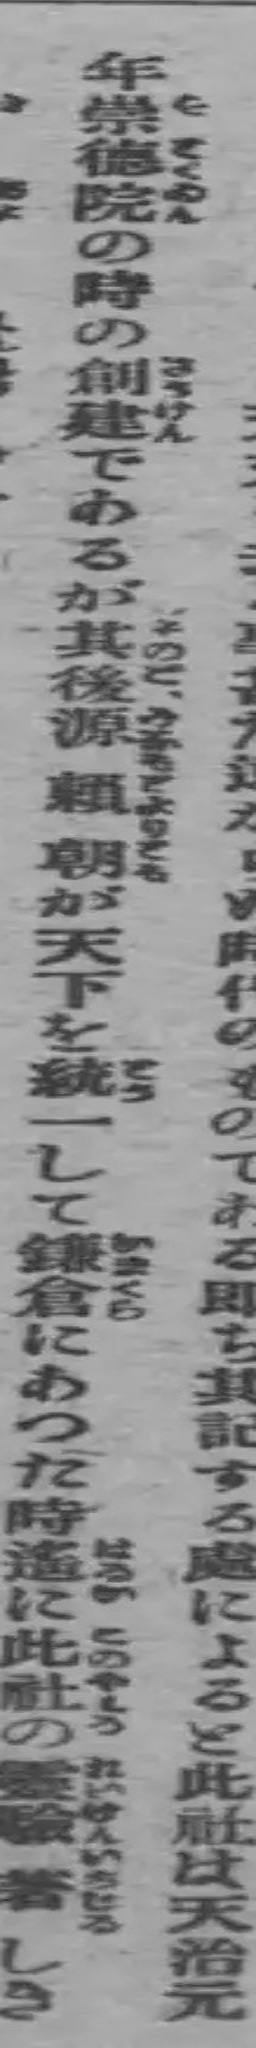年崇徳院の時の創建であるが其後源頼朝が天下を統一して鎌倉にあつた時遥に此社の霊験著しき
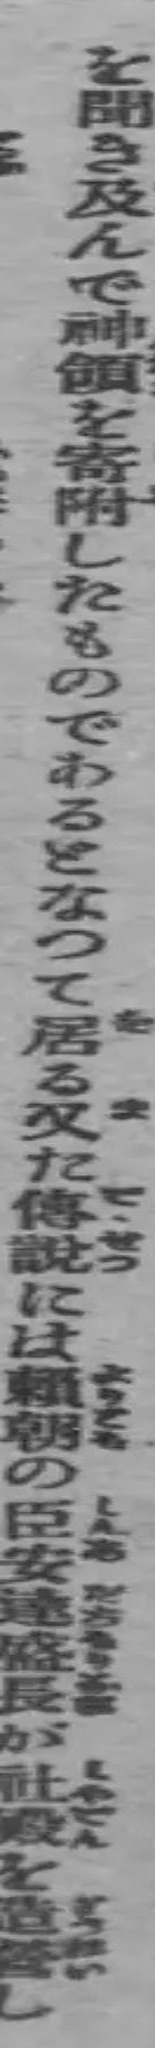を聞き及んで神領を寄附したものであるとなつて居る又た伝説には頼朝の臣安達盛長が社殿を造営し
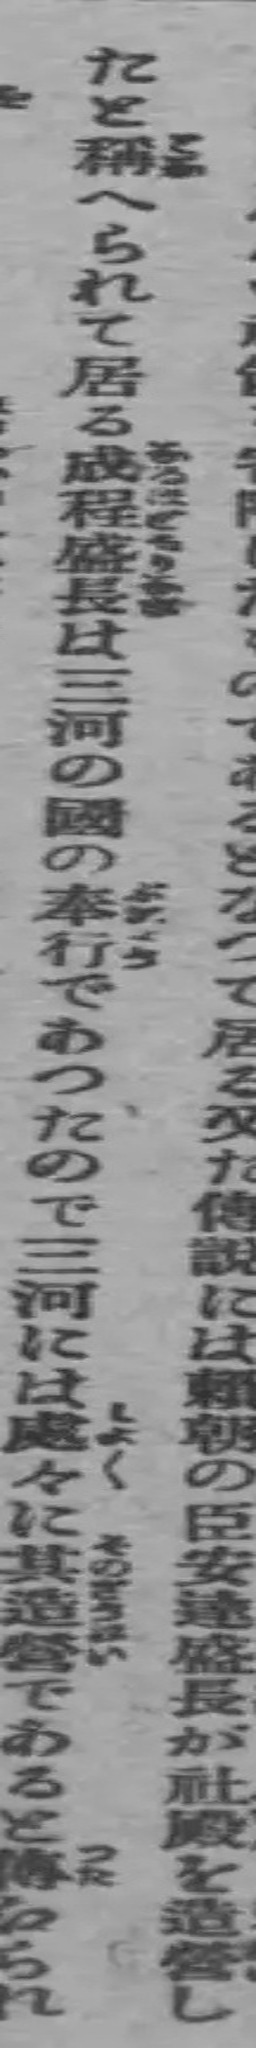たと称へられて居る成程盛長は三河の国の奉行であつたので三河には処々に其造営であると伝えられ
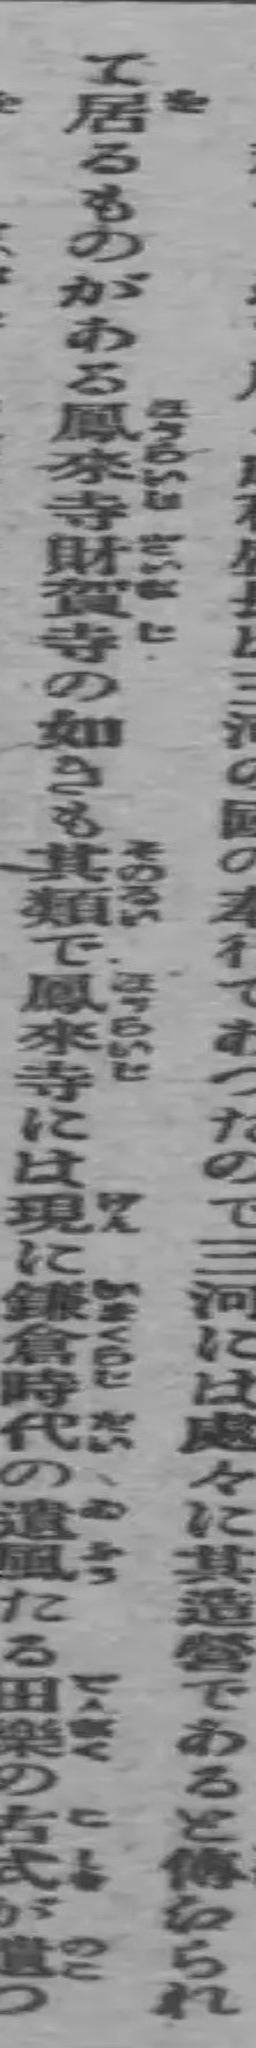て居るものがある鳳来寺財賀寺の如きも其類で鳳来寺には現に鎌倉時代の遺風たる田楽の古式が遺つ
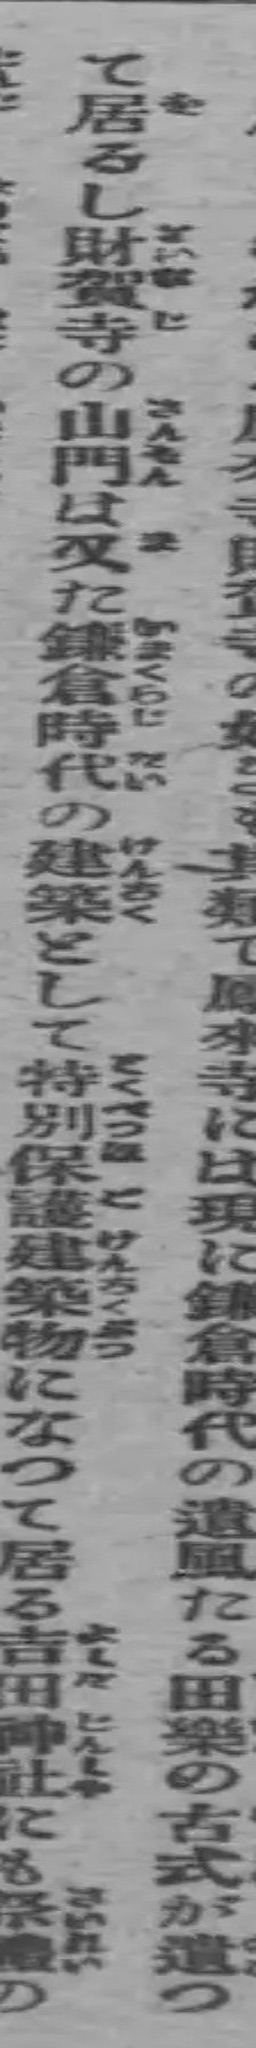て居るし財賀寺の山門は又た鎌倉時代の建築として特別保護建築物になつて居る吉田神社にも祭礼の
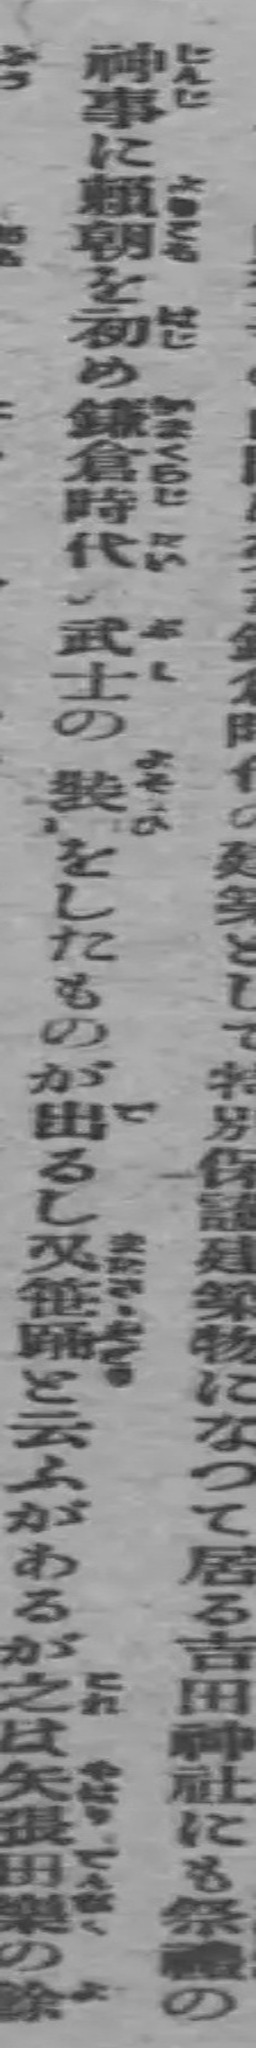笹踊神事に頼朝を初め鎌倉時代の武士の装をしたものが出るし又笹踊と云ふがあるが之は矢張田楽の余
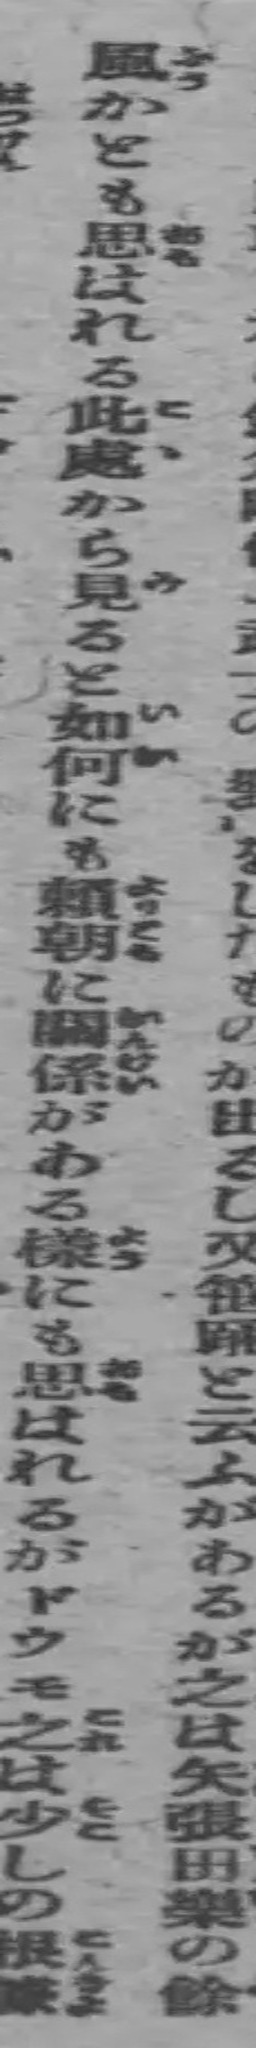風かとも思はれる此処から見ると如何にも頼朝に関係がある様にも思はれるがドウモ之は少しの根拠
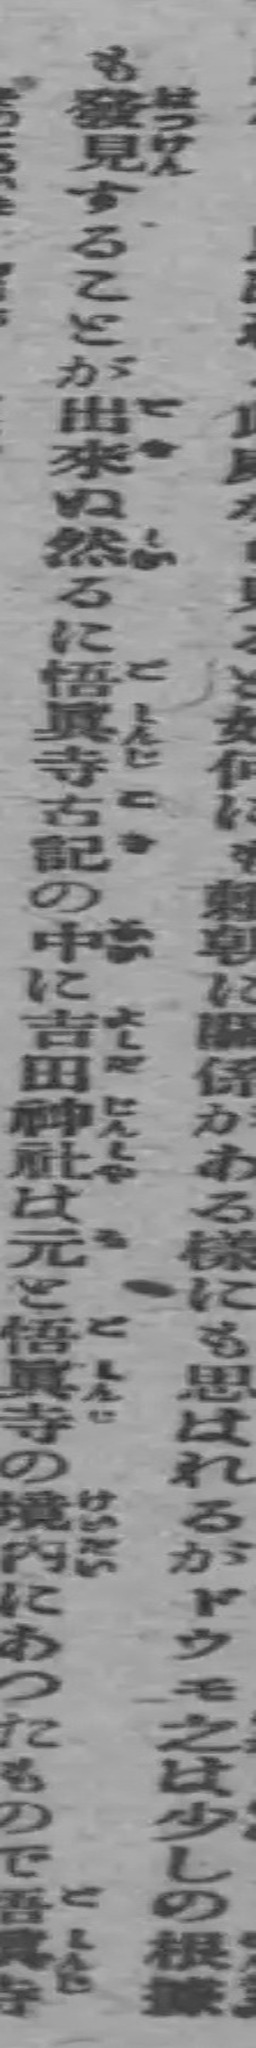も発見することが出来ぬ然るに悟眞寺古記の中に吉田神社は元と悟眞寺の境内にあつたもので悟眞寺
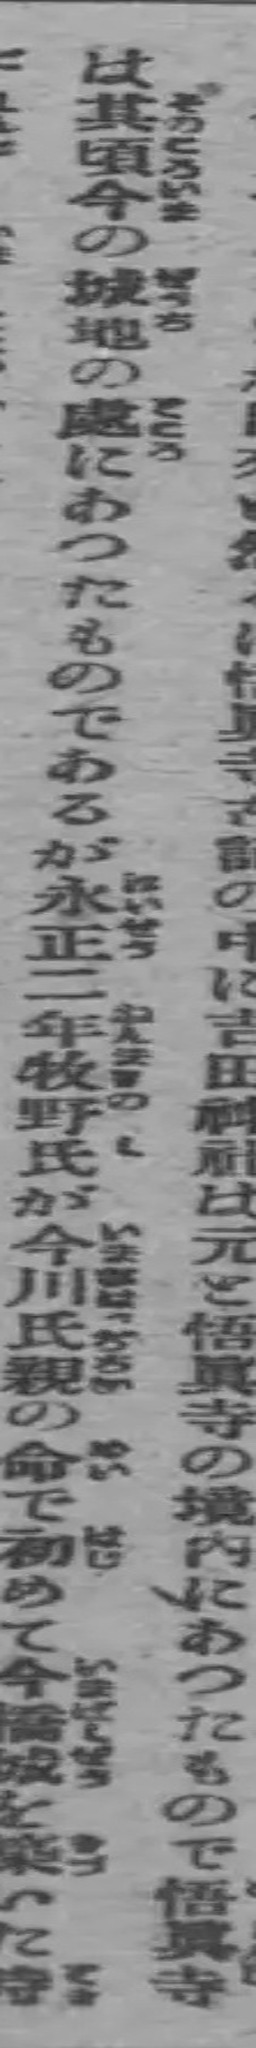は其頃今の城地の処にあつたものであるが永正二年牧野氏が今川氏親の命で初めて今橋城を築いた時
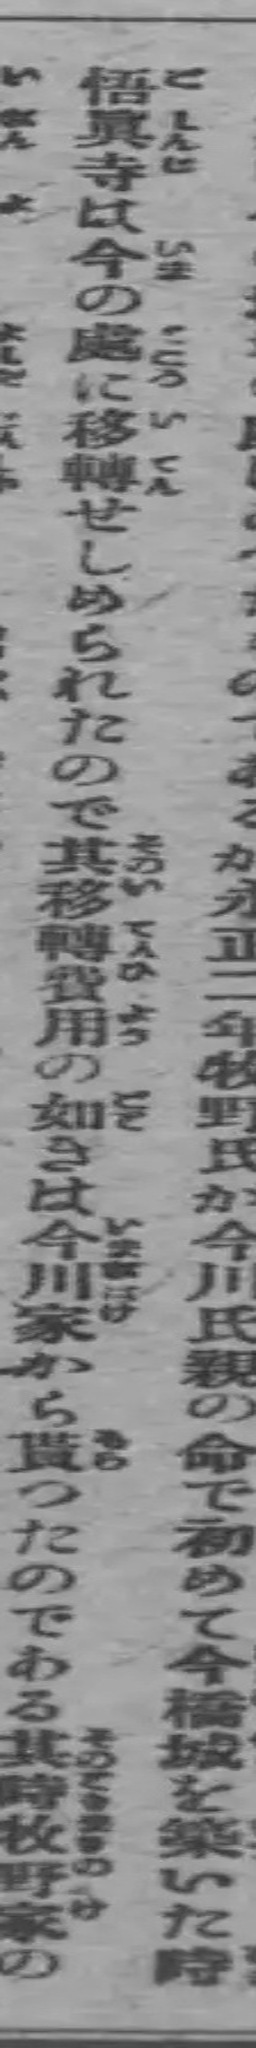悟眞寺は今の処に移転せしめられたので其移転費用の如きは今川家から貰つたのである其時牧野家の
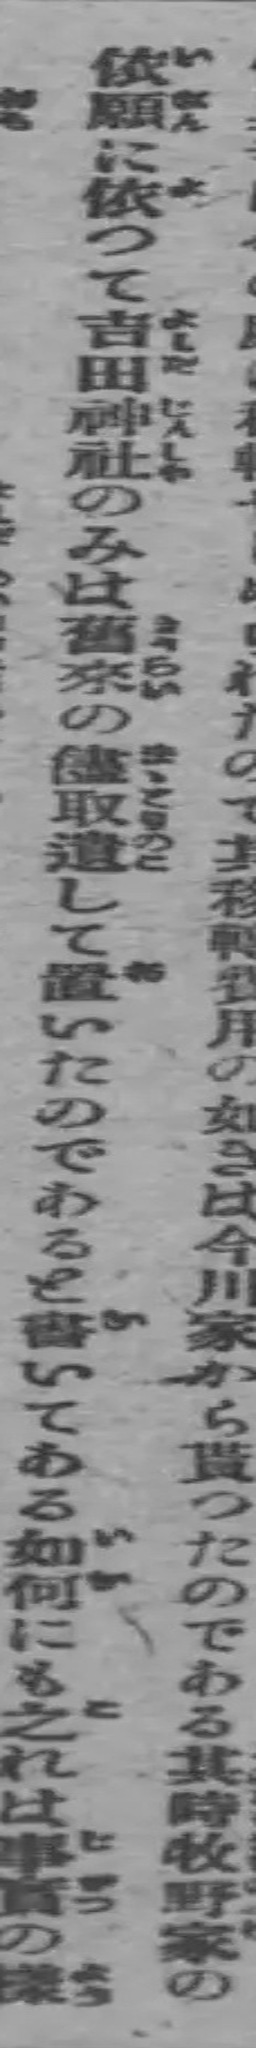依願に依つて吉田神社のみは旧来の侭取遺して置いたのであると書いてある如何にも之れは事実の様
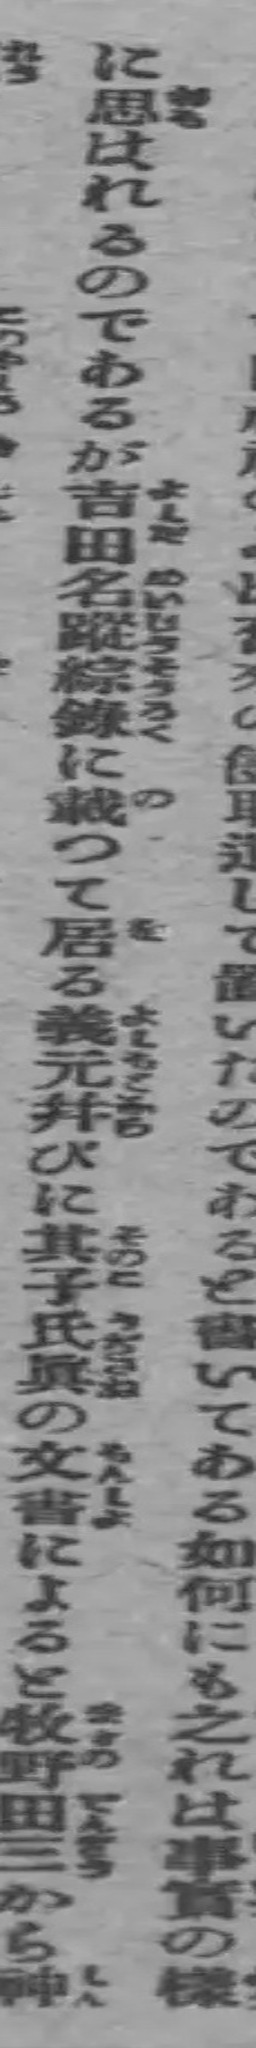に思はれるのであるが吉田名蹤綜録に載つて居る義元幷びに其子氏眞の文書によると牧野田三から神
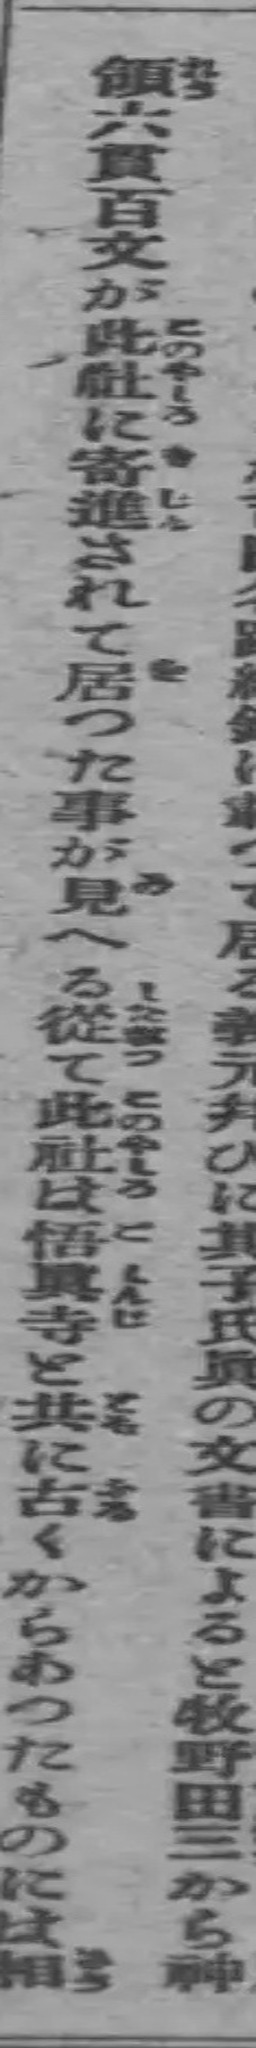領六貫百文が此社に寄進されて居つた事が見へる従て此社は悟眞寺と共に古くからあつたものに相
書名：豊橋市史談
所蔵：国立国会図書館 National Diet Library, JAPAN
